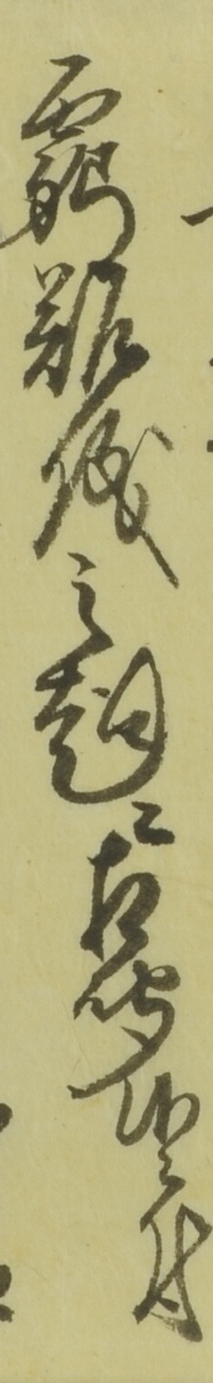窮難儀之趣ニ相聞候ニ付
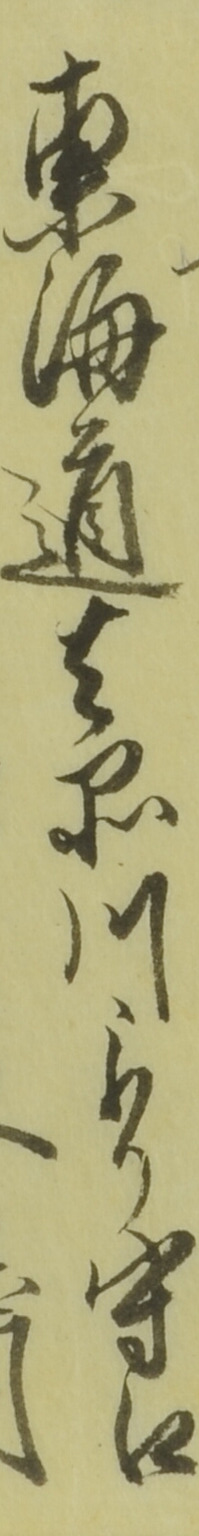東海道は品川より守口
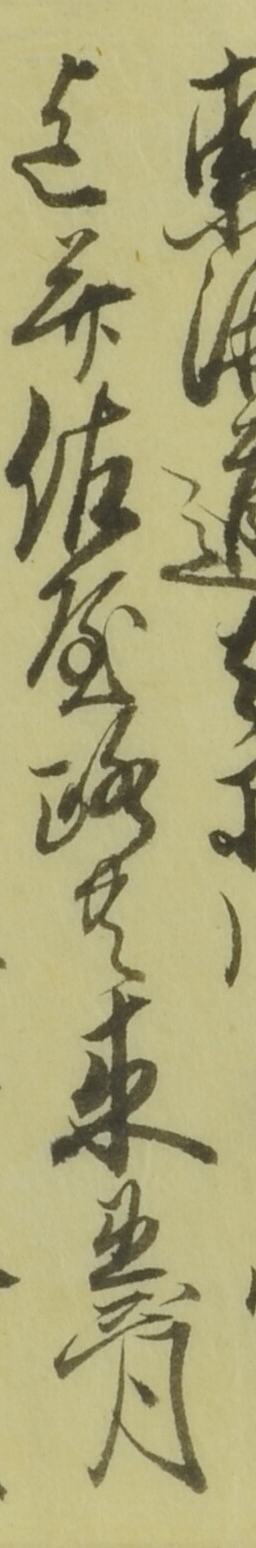迄并佐屋路共来丑正月
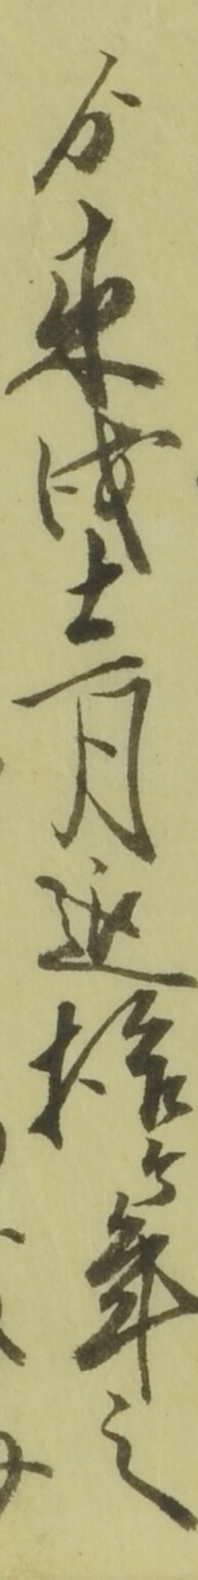ゟ来戌十二月迄拾ヶ年之
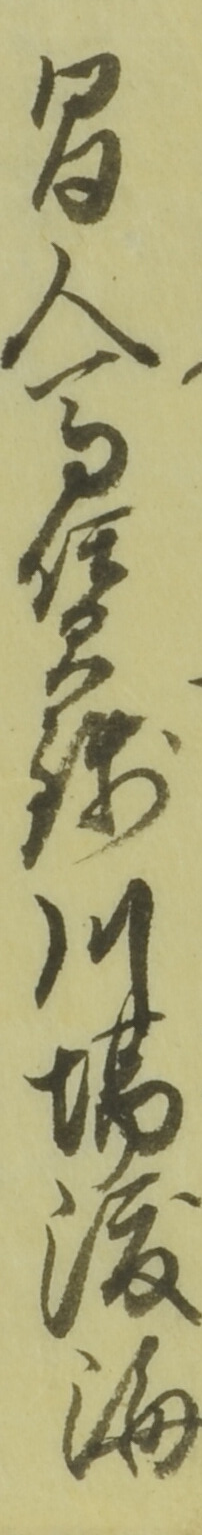間人馬賃銭川場渡海
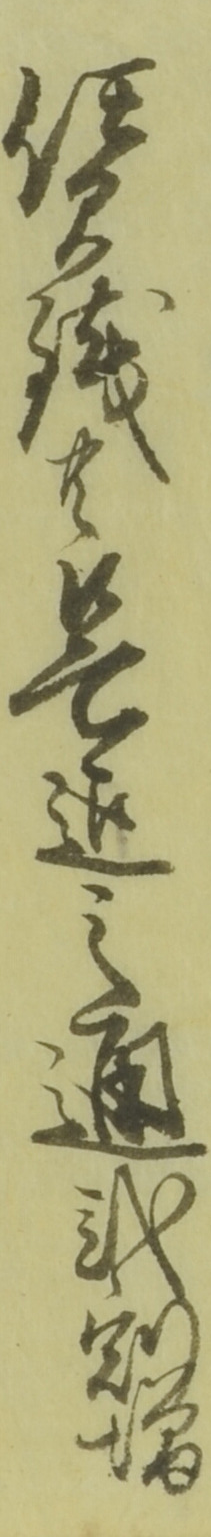賃銭共是迄之通弐割増
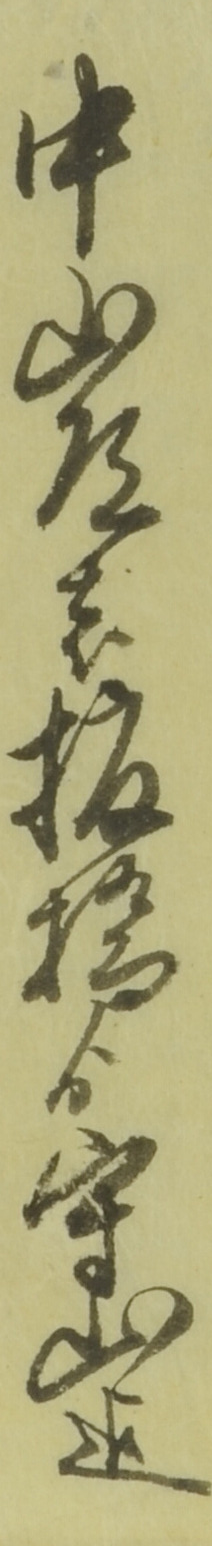中山道は板橋ゟ守山迄

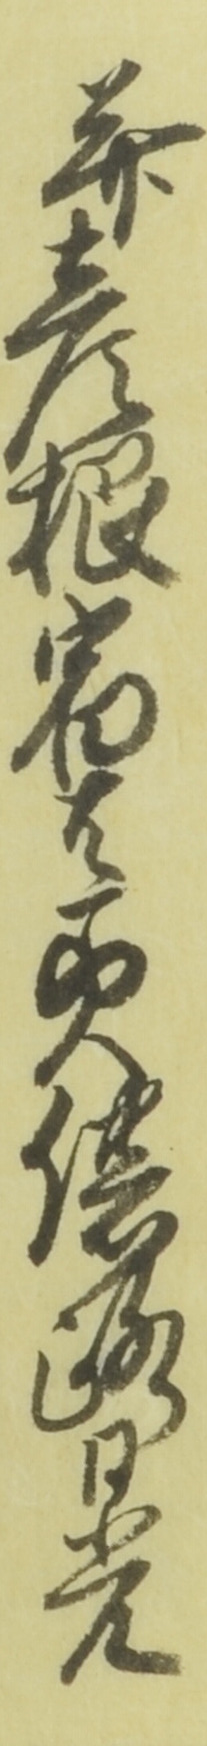并彦根宿共美濃路日光
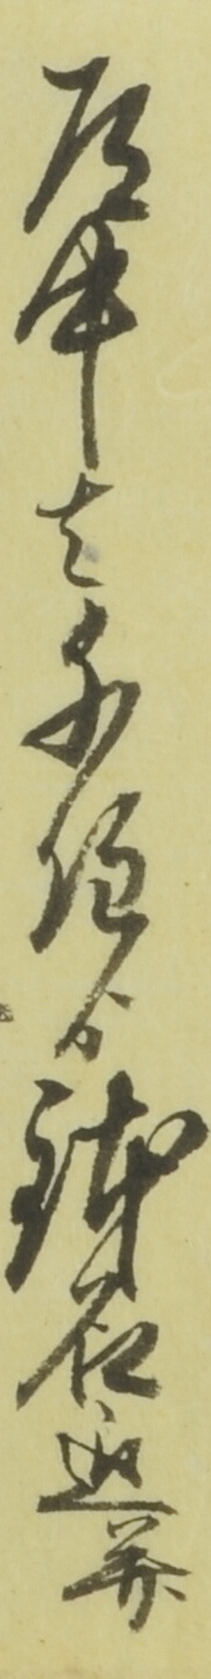道中は千住ゟ鉢石迄迄并
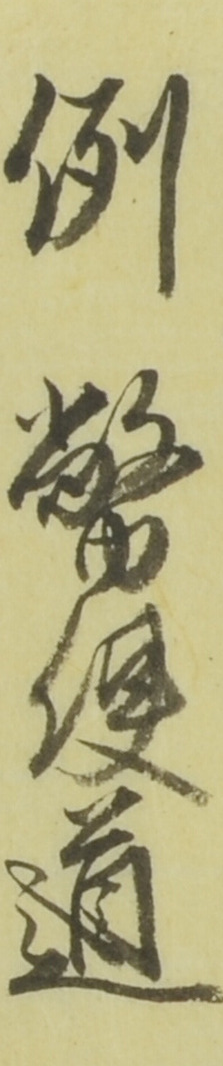例幣使道
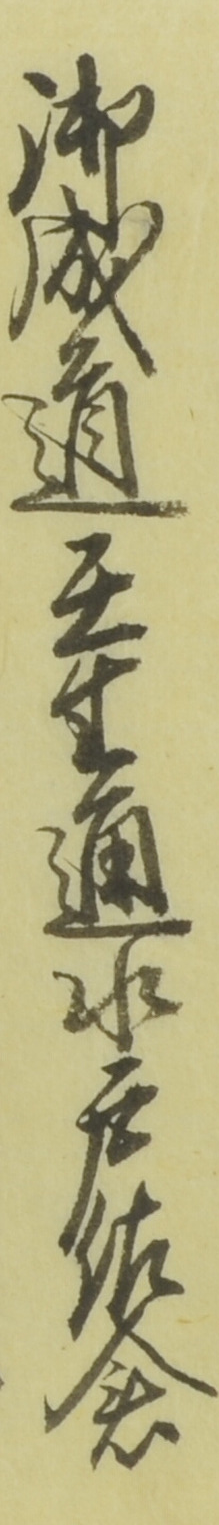御成道壬生通水戸佐倉
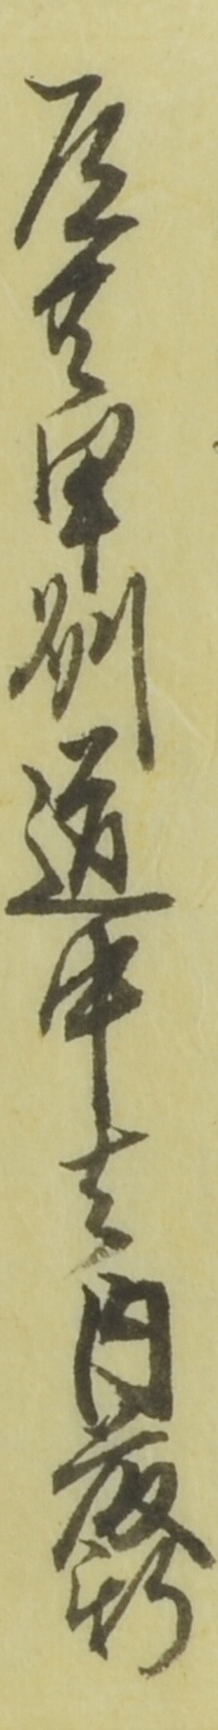道共甲州道中は内藤新
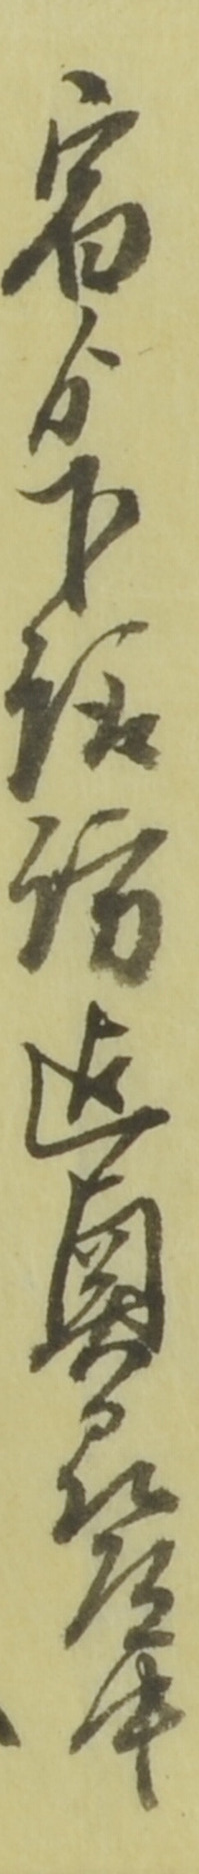宿ゟ下諏訪迄奥州道中
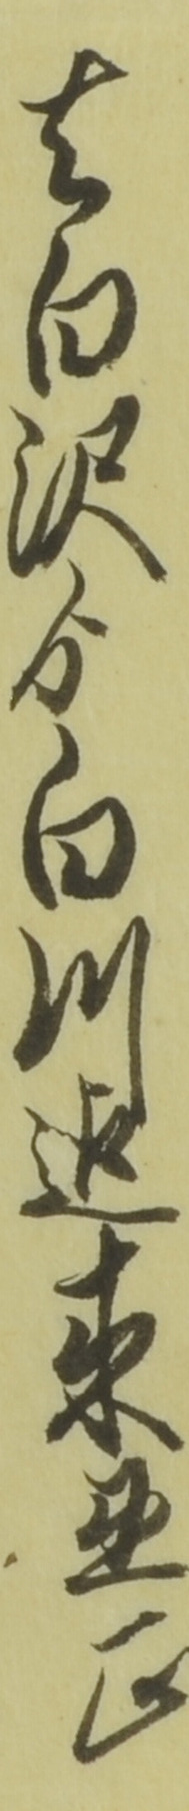は白沢ゟ白川迄来丑正
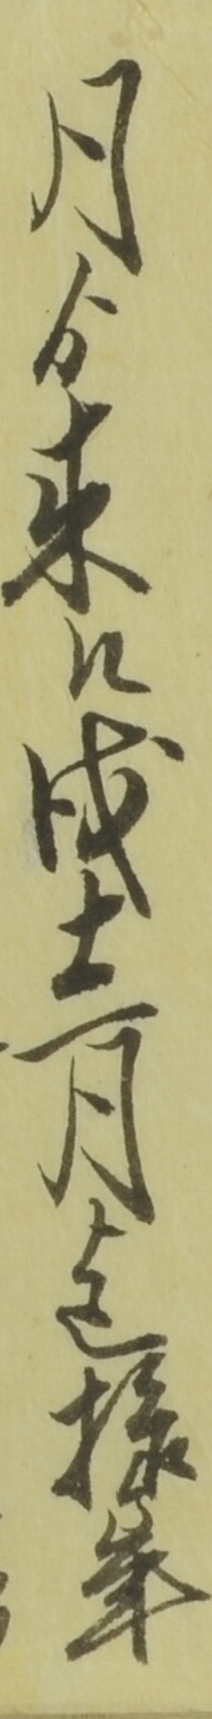月ゟ来ル戌十二月迄拾年
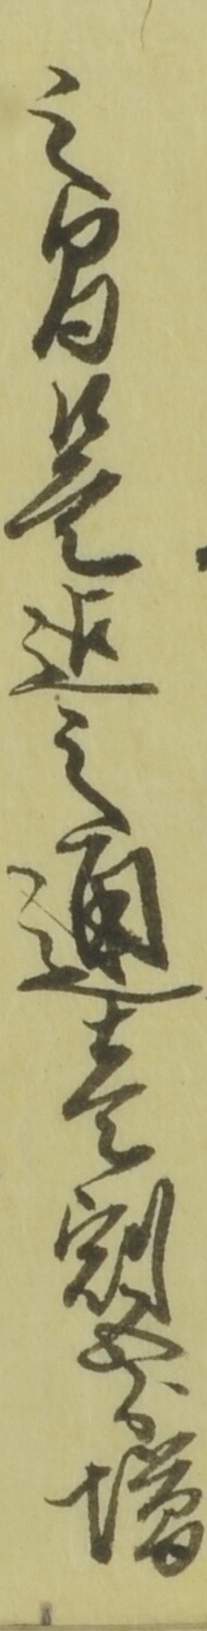之間是迄之通壱割五分増
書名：御触書御書附控
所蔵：伊那市立高遠町図書館・合同会社AMANE
